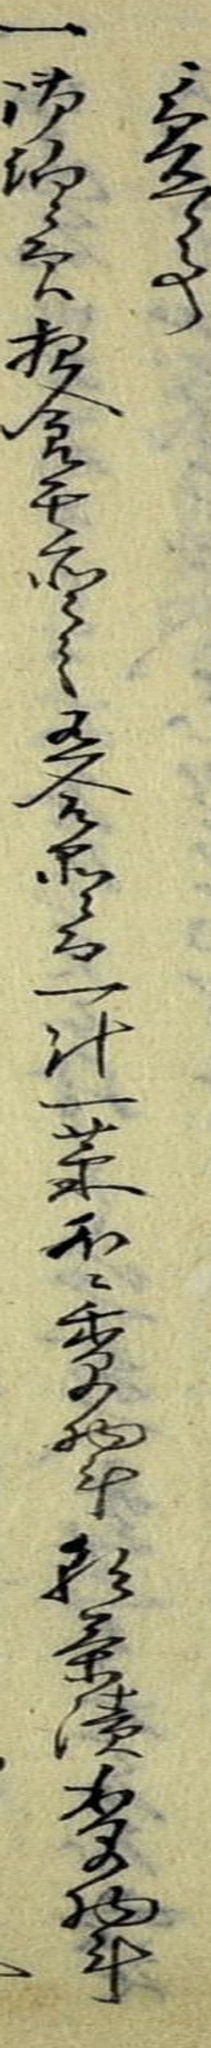一御泊に而は夜食其所々之有合品に而一汁一菜外に香之物斗朝茶漬香之物斗
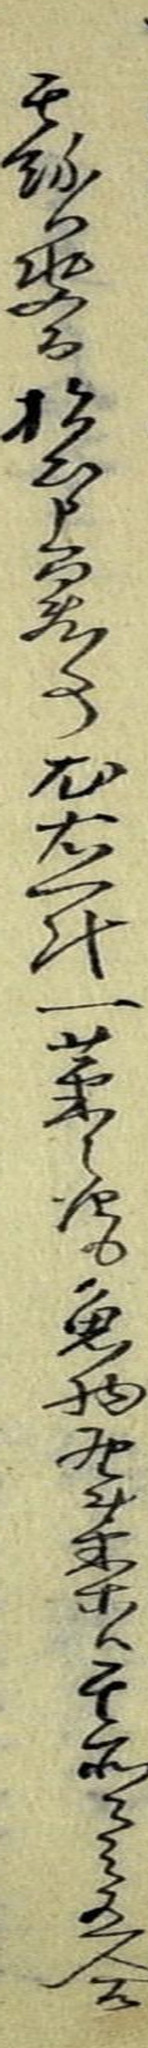其餘は決而指出申間敷事尤右一汁一菜之儀も魚物野菜等は其所々之有合
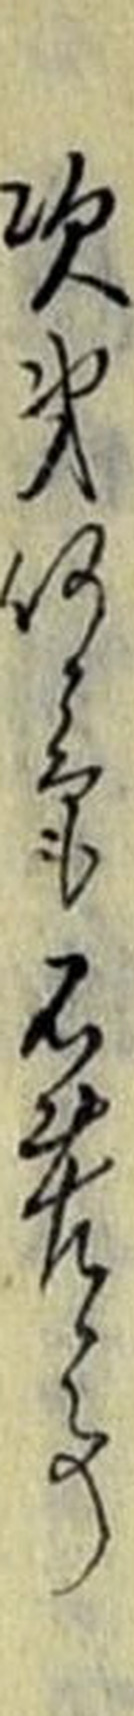次第何に而も不苦候事
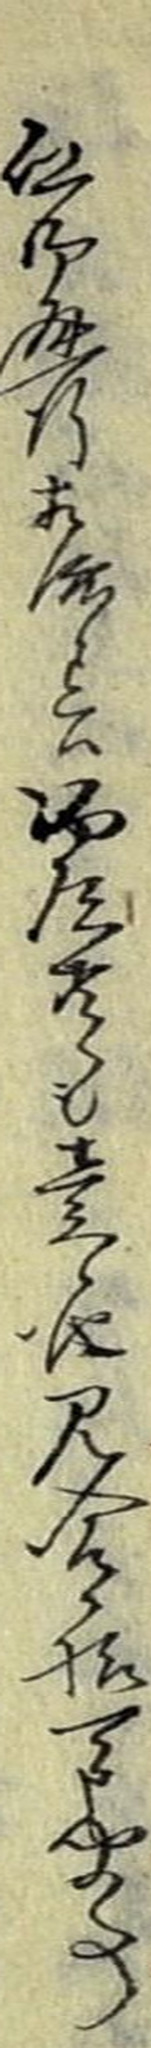但御通行相済候迄は酒屋共へも売候儀見合候様可申聞事
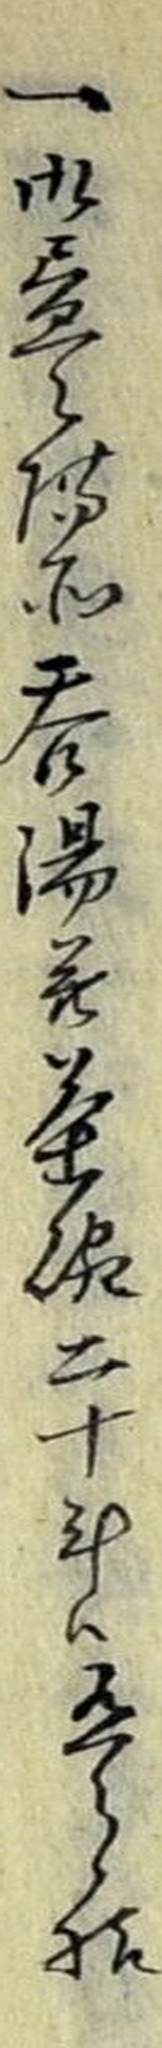一御昼之場所呑湯并茶碗二十斗は有之候様
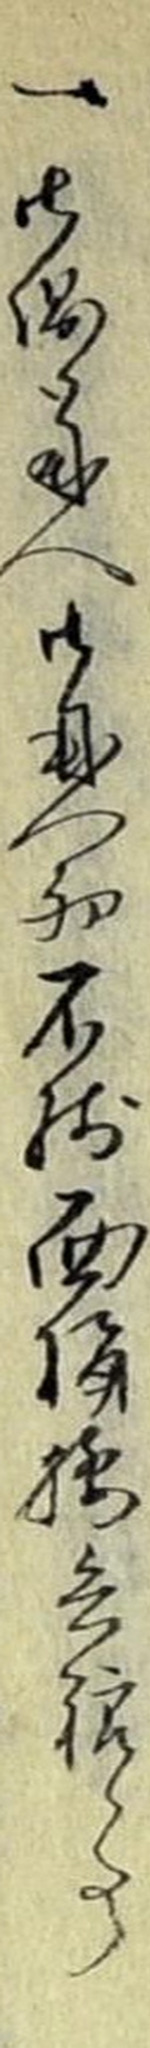一御側御用人御用人初不残面桶腰兵粮之事
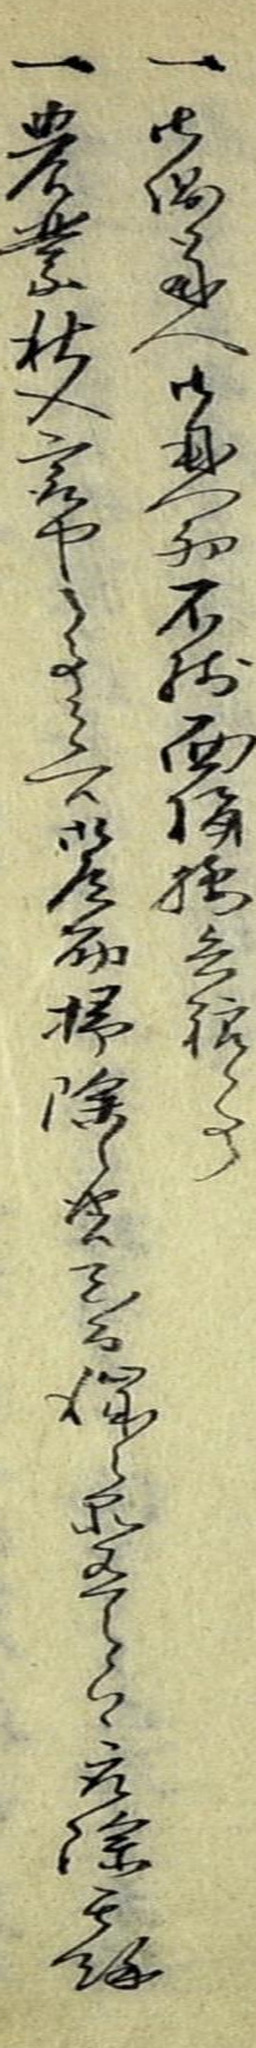一農業秋入最中之事に候へは御道筋掃除之儀は至而穢候品有之候はヽ取除其餘
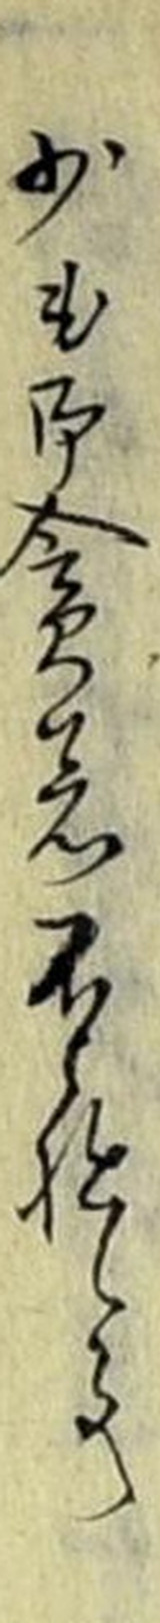少も御貪着不被遊候事
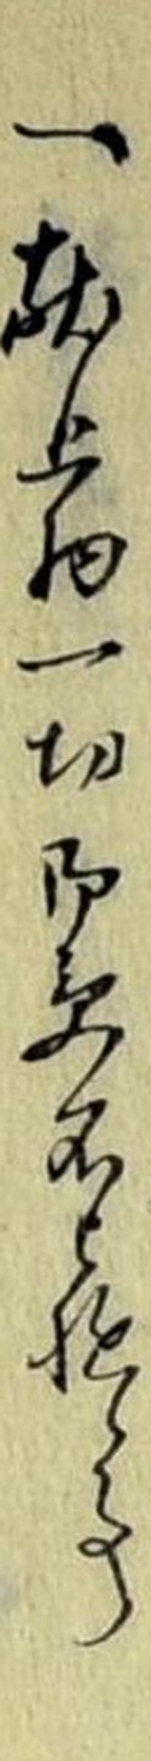一献上物一切御受不被遊候事
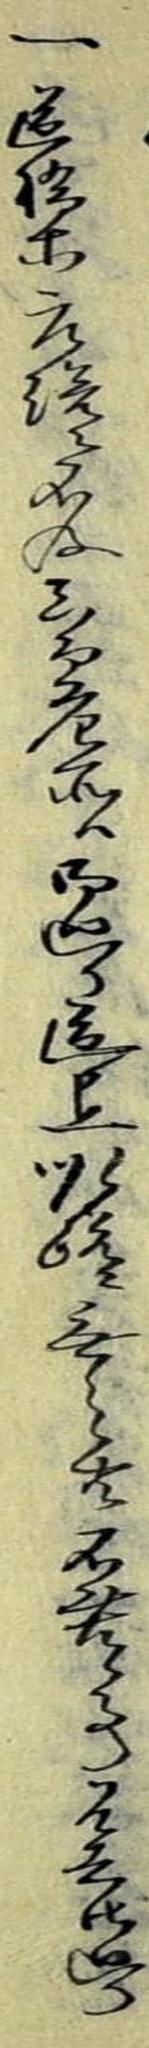一道橋等取繕に不及至而危所は御廻り道申上順路に無之候共不苦候事乍去御廻り

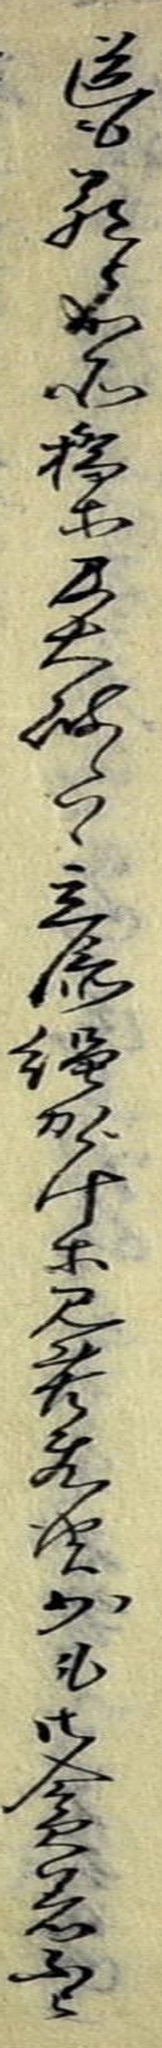道も難被成所橋等及大破候はヽ立添縄からけ等見苦敷儀は少も御貪着不被
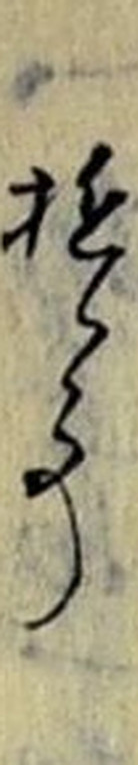遊候事
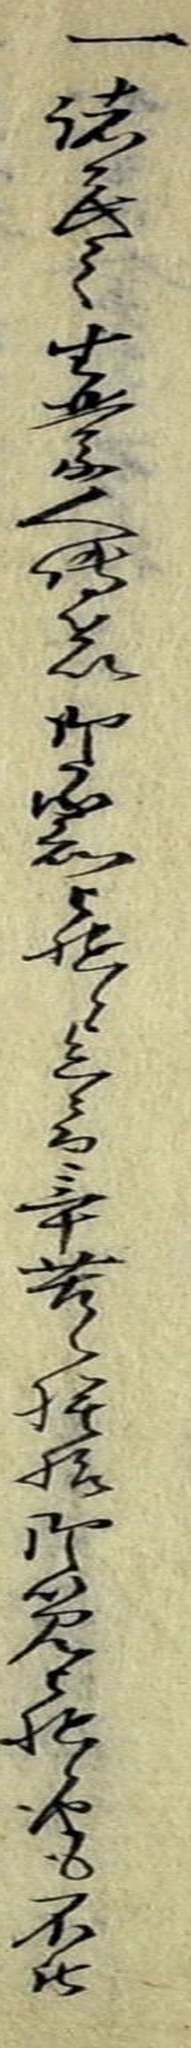一諸民之生業人伝を以御承知被遊候迄に而三十苦之模様御覧被遊候儀も不被
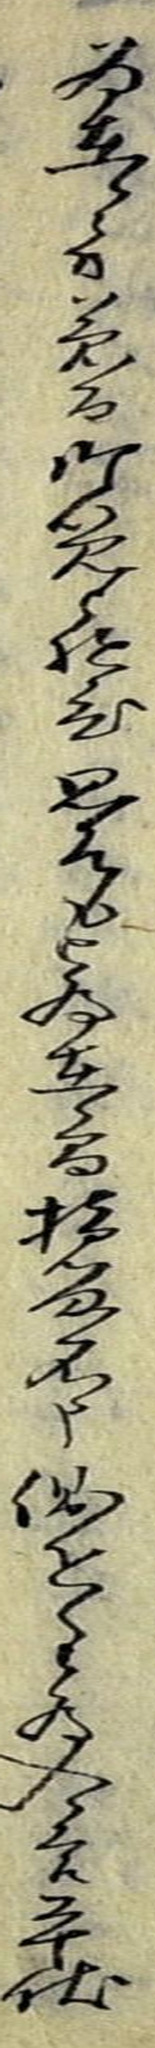為在候に付兼而御覧被遊度思召も被為在候間指留不申側近く被為入候節平伏
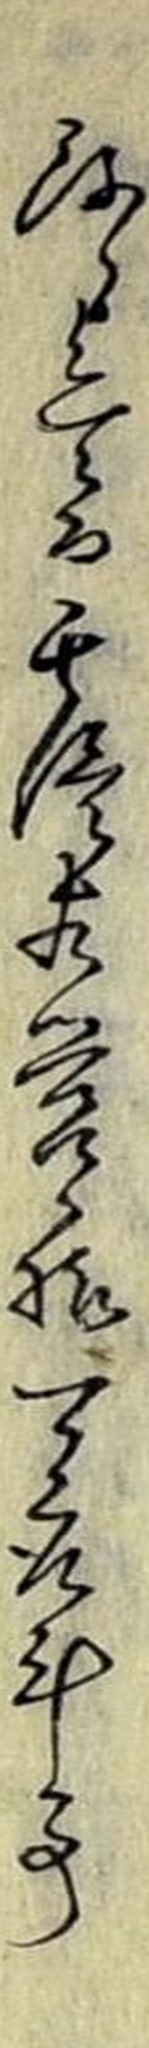致候迄に而其侭相営候様可取斗事
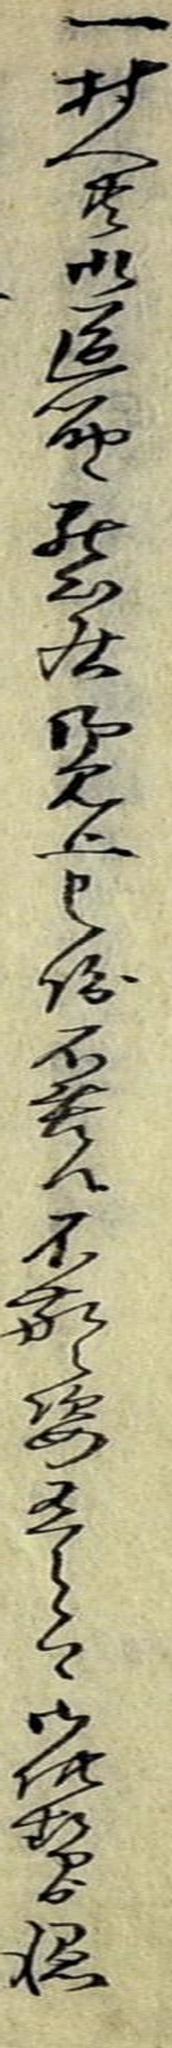一村人共御道筋へ罷出居御見上申儀不苦候不敬之姿有之候はヽ御供勢ゟ穏
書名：命令之部 六
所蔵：福井県文書館 Fukui Prefectural Archives
